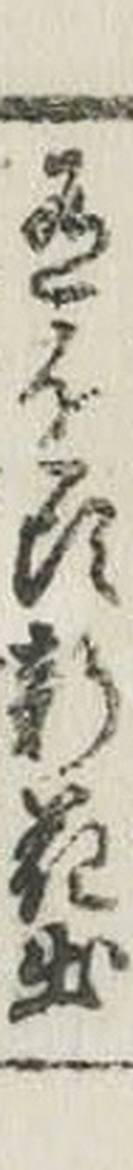有近頃新花出
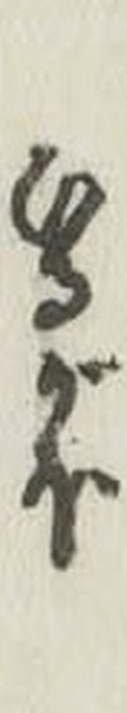ひるがほ
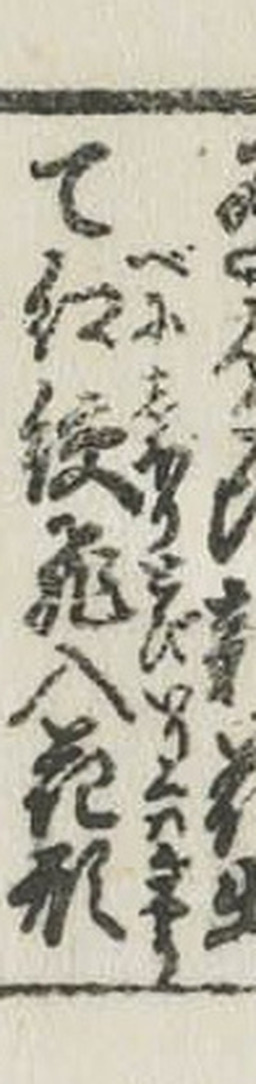て紅絞飛入花形
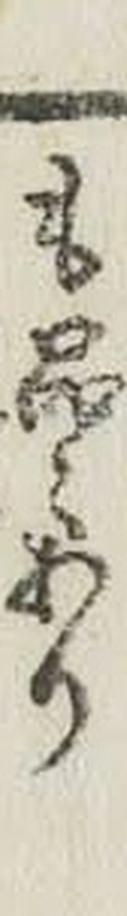も品々あり
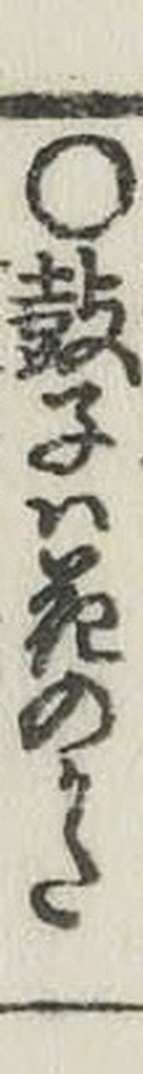○鼓子は花のかた
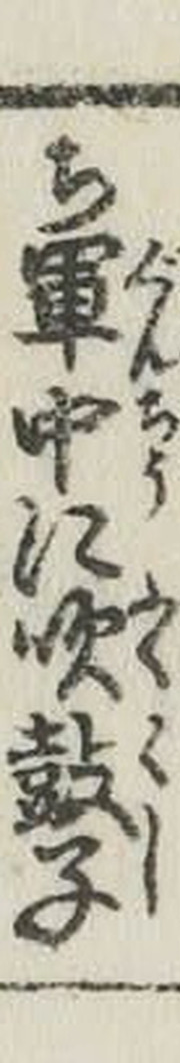ち軍中に吹鼓子
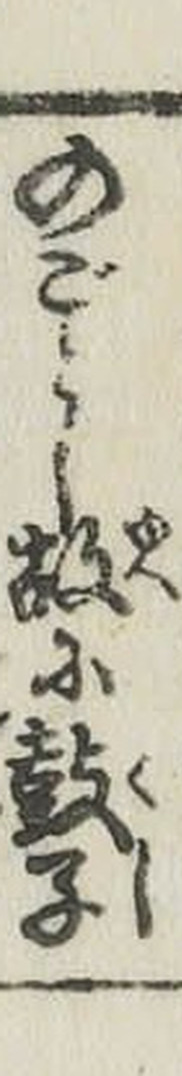のごとし故に鼓子
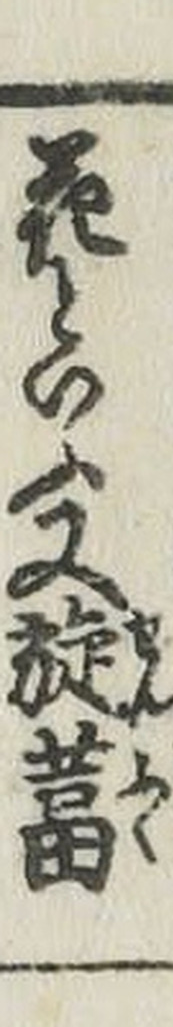花といふ又旋葍
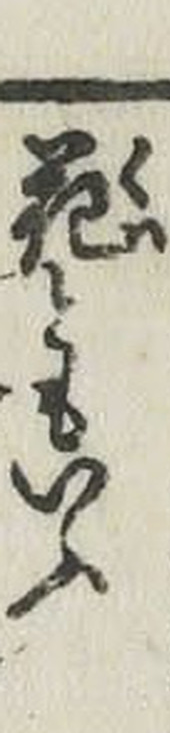花ともいふ
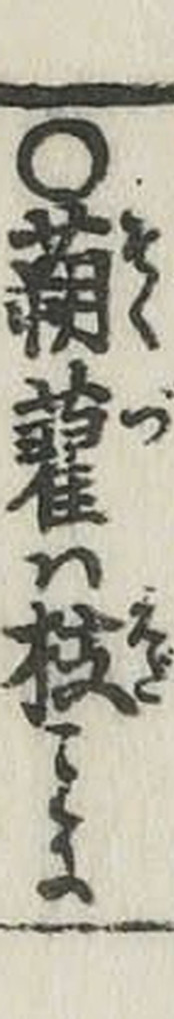○蒴藋は枝ことに
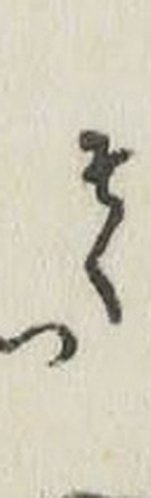そくつ
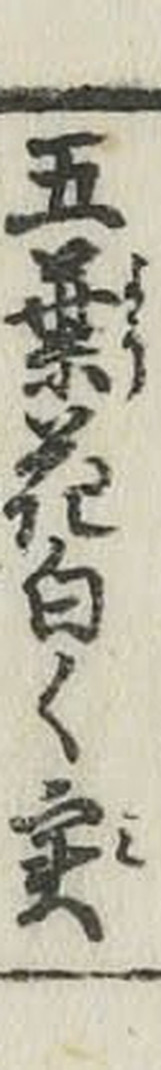五葉花白く実
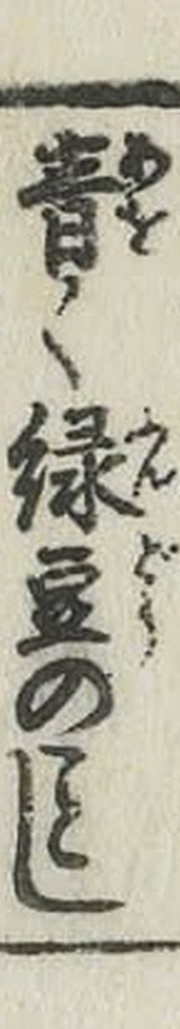青く緑豆のことし
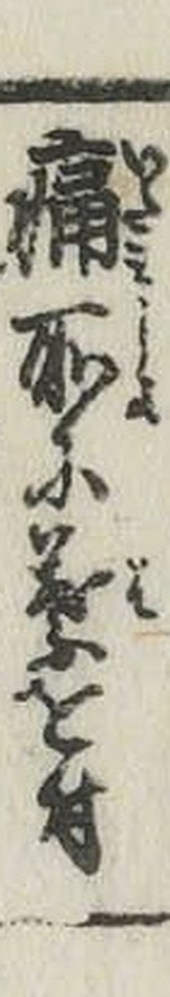痛所に葉を付
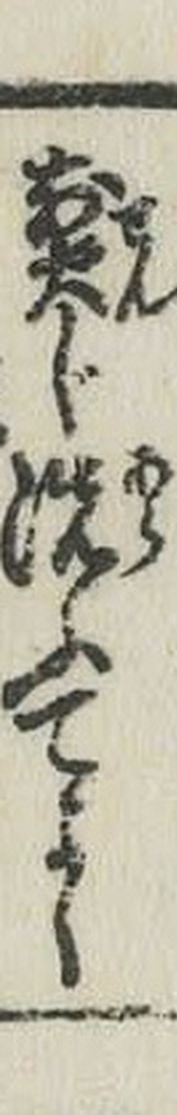煎じ洗ふてよし

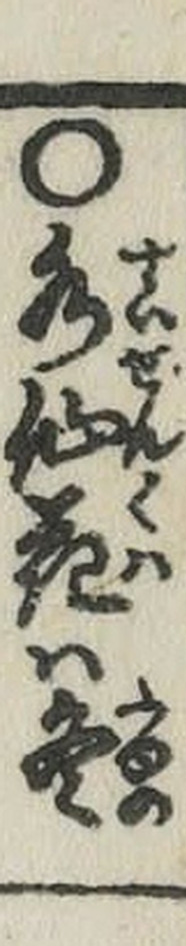○水仙花は冬の
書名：増補頭書訓蒙図彙大成 10巻 9:巻之20
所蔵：東京学芸大学教育コンテンツアーカイブ
